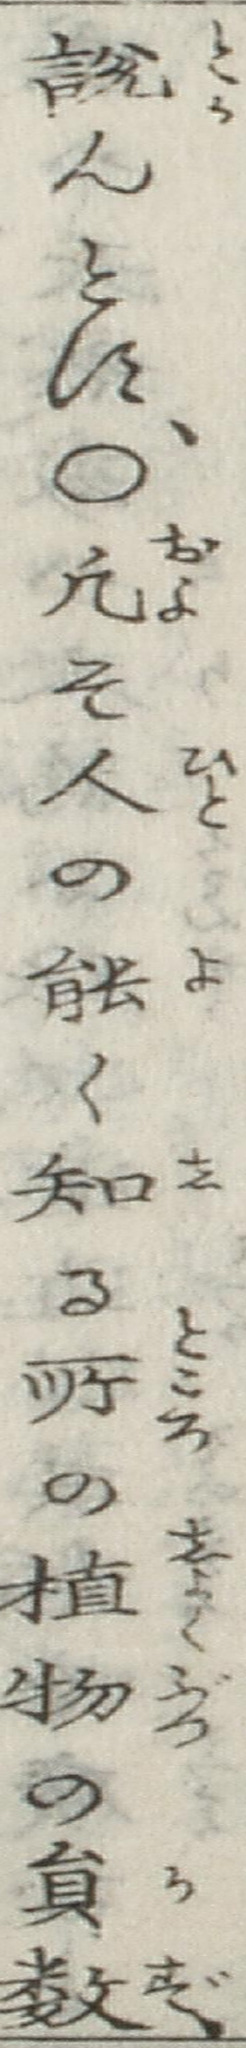説んとす、○凡そ人の能く知る所の植物の員数、
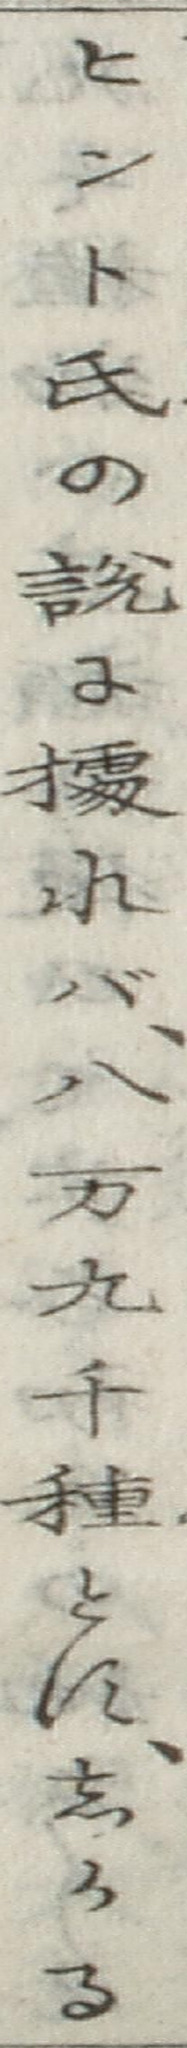ヒント氏の説に拠れば、八万九千種とす、しかる
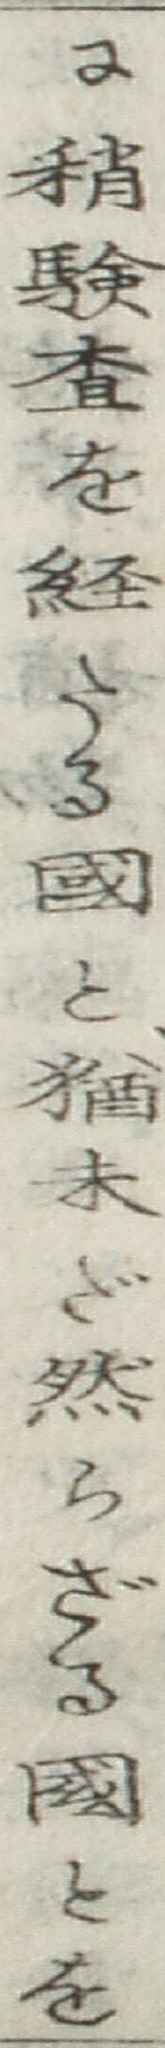に稍験査を経たる国と、猶未だ然らざる国とを
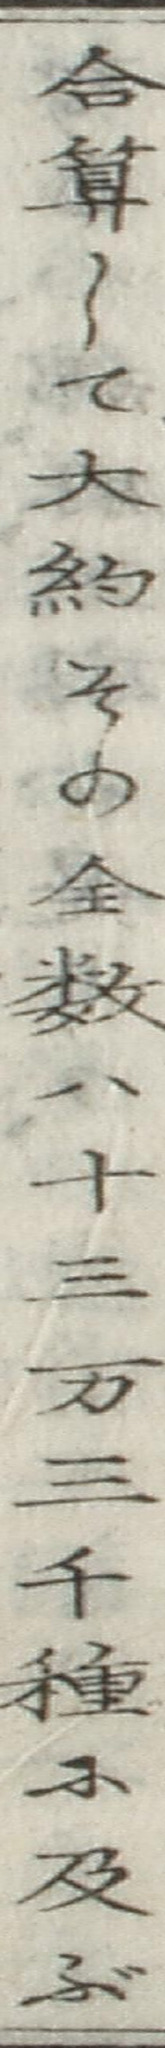合算して、大約その全数八十三万三千種に及ぶ
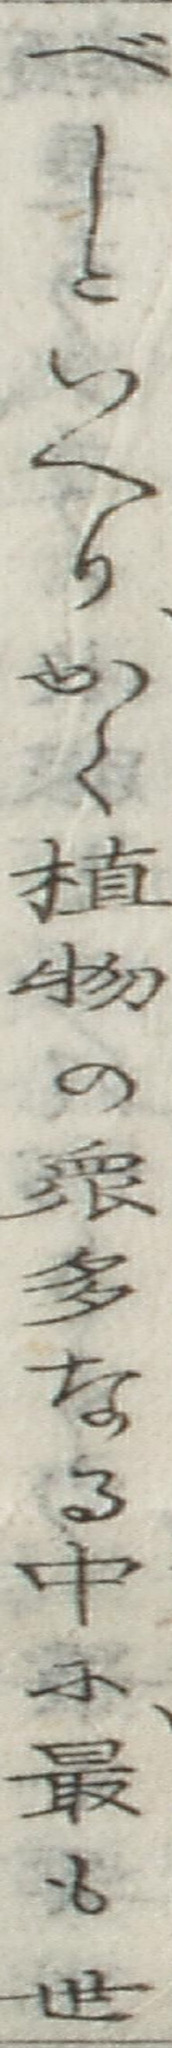べしといへり、かく植物の衆多なる中に、最も世
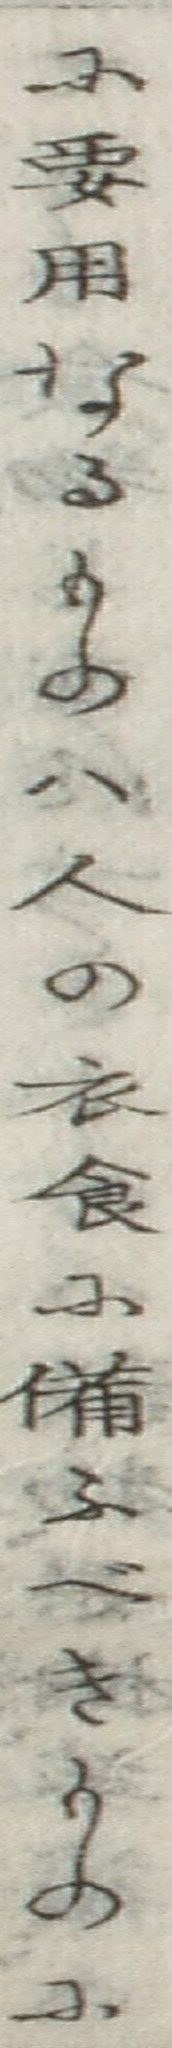に要用なるものは人の衣食に備ふべきものに

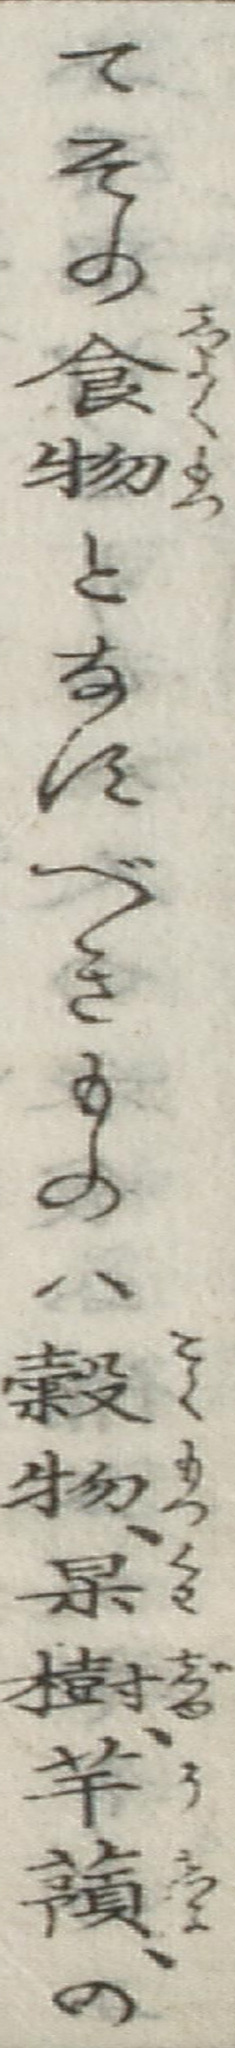てその食物となすべきものは穀物、果樹、芋蕷、の
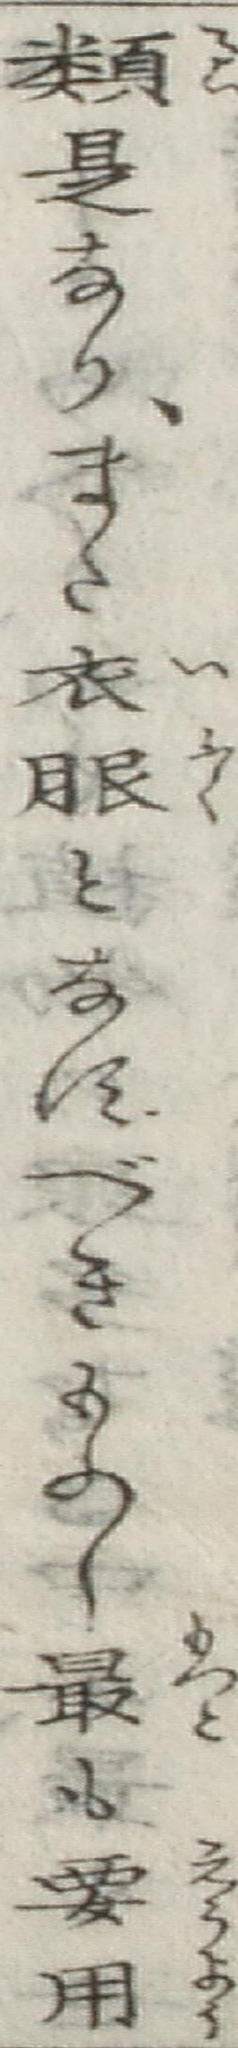類是なり、また衣服となすべきものゝ最も要用
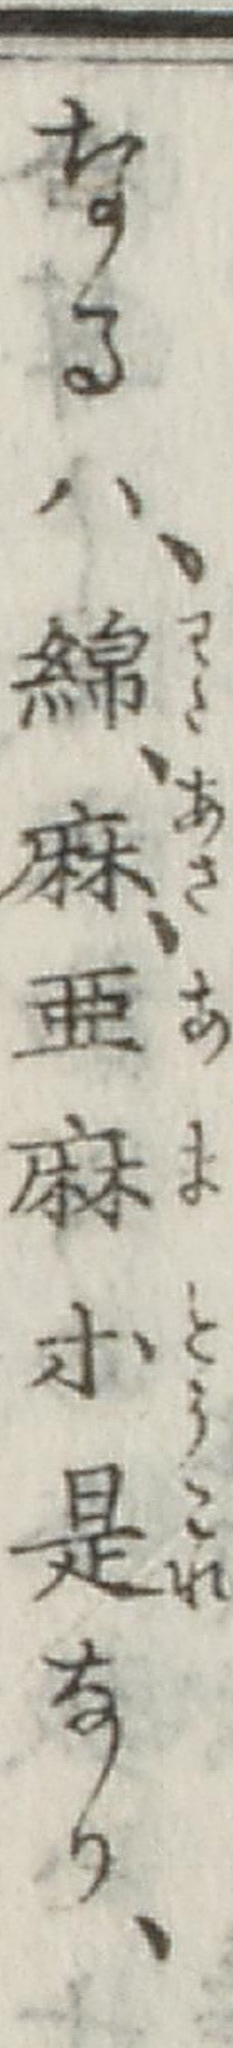なるは、綿、麻、亜麻等是なり、
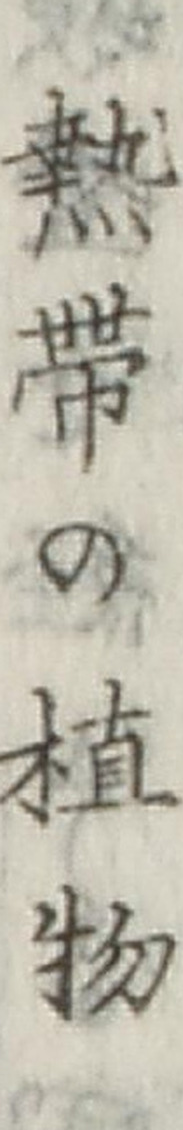熱帯の植物
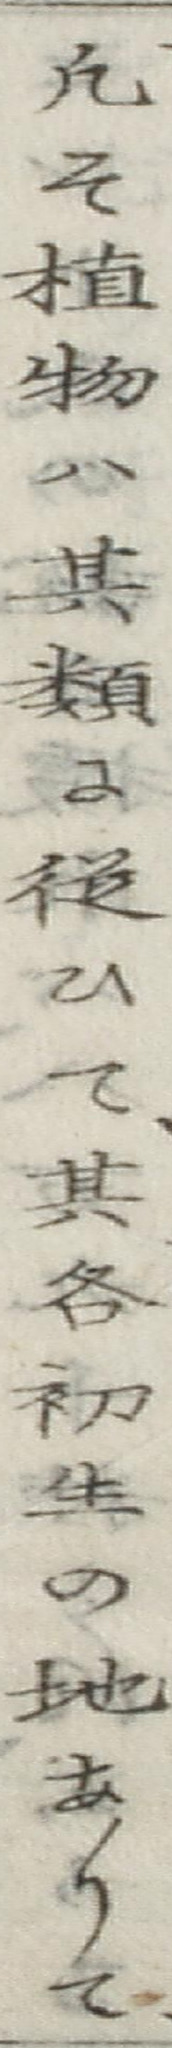凡そ植物は其類に従ひて、其各初生の地ありて、
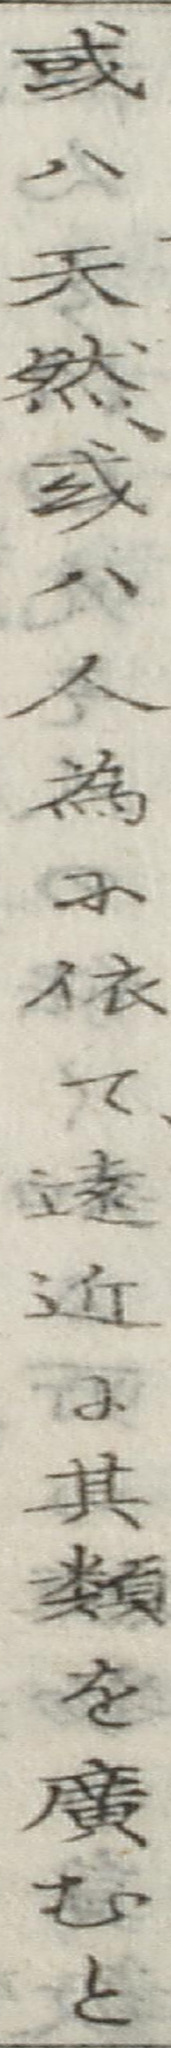或は天然、或は人為に依て、遠近に其類を広むと
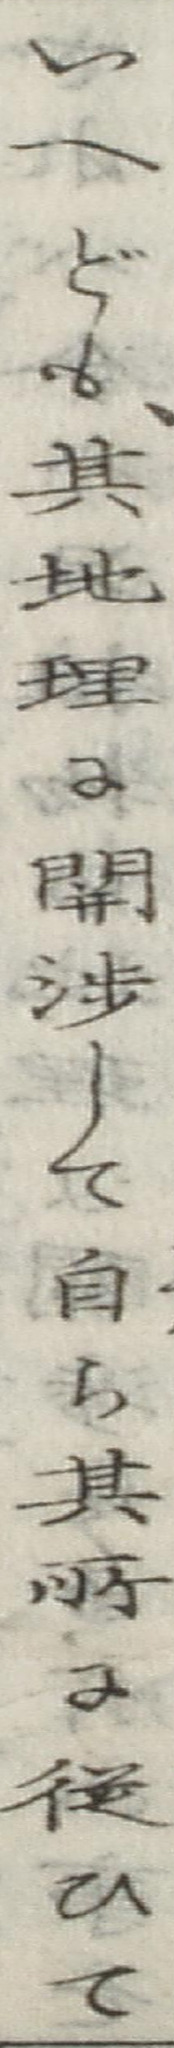いへども、其地理に関渉して自ら其所に従ひて
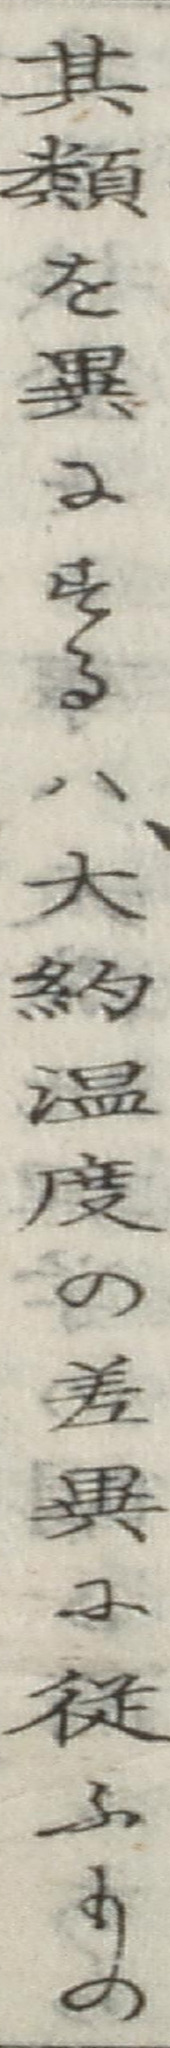其類を異にするは、大約温度の差異に従ふもの
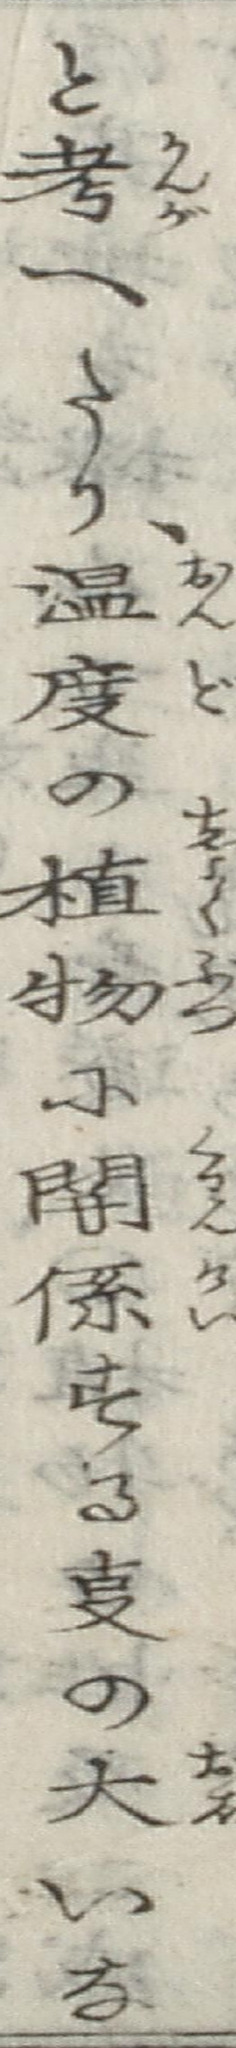と考えたり、温度の植物に関係する事の大いな
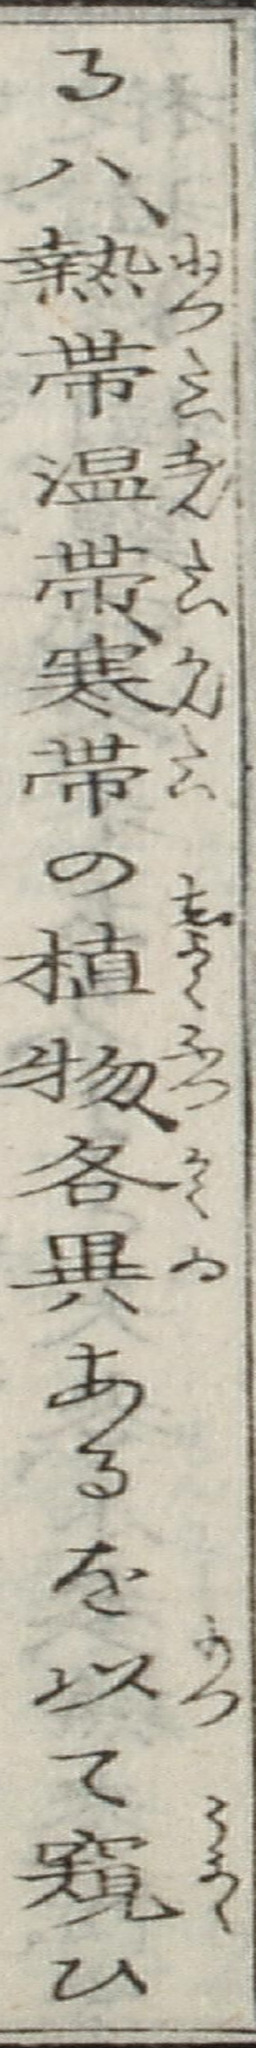るは、熱帯温帯、寒帯の植物、各異あるを以て窺ひ
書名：訓蒙　天然地理學　下
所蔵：東京大学地震研究所図書室 Earthquake Research Institute Library, The University of Tokyo, JAPAN
